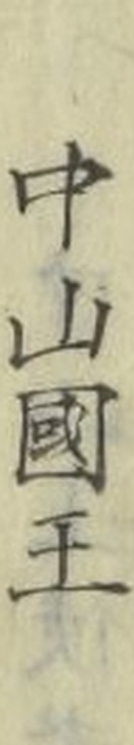中山国王
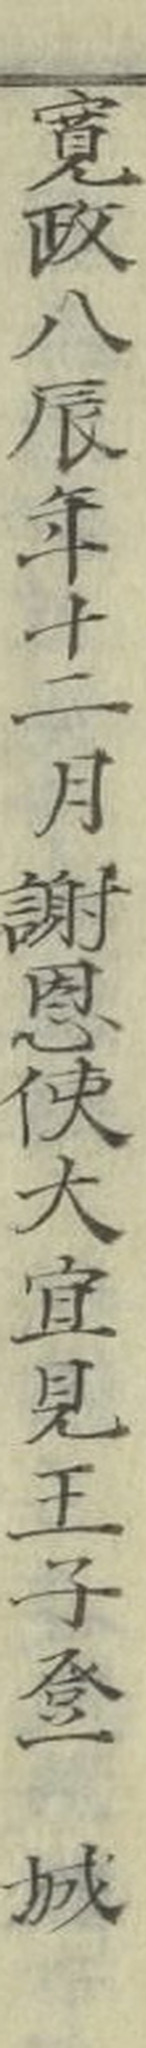寛政八辰年十二月謝恩使大宜見王子登城
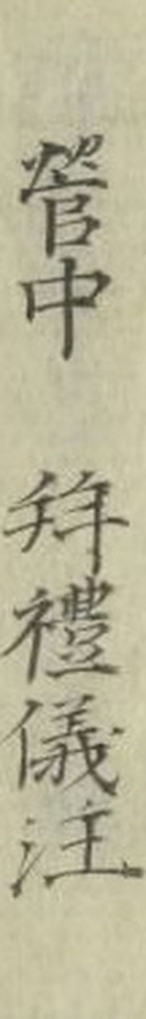営中拝礼儀注
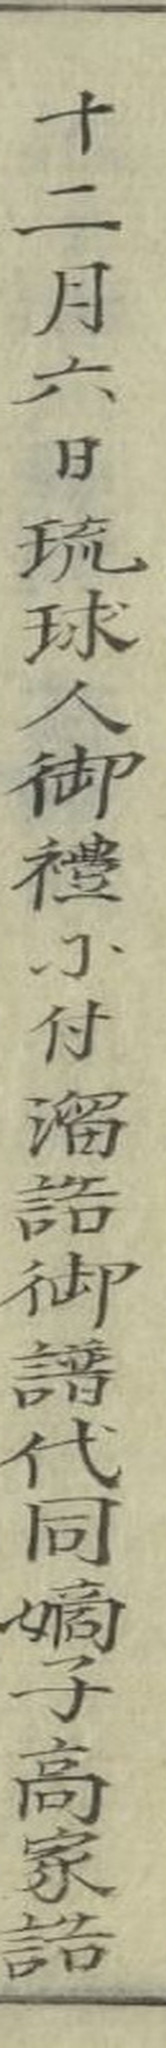十二月六日琉球人御礼に付溜誥御譜代同嫡子高家誥
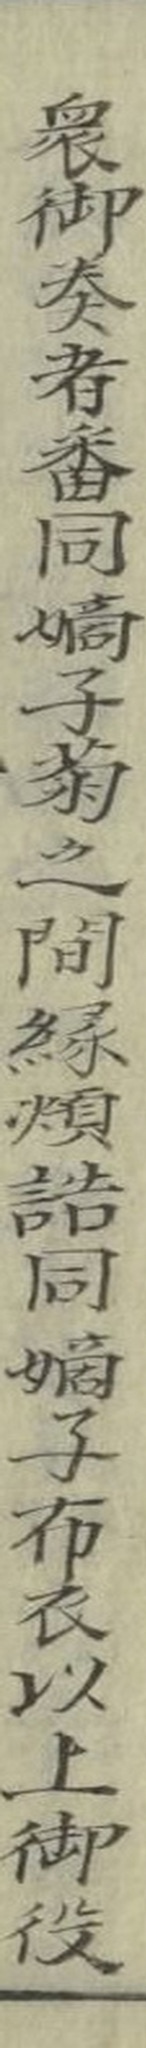衆御奏者番同嫡子菊之間縁煩誥同嫡子布衣以上御役

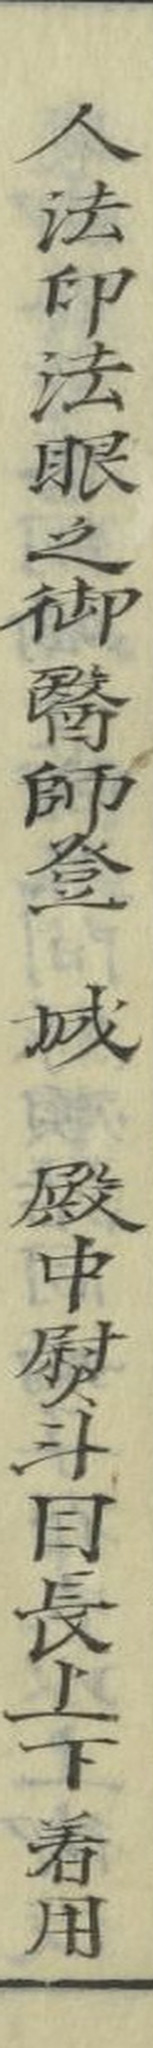人法印法眼之御医師登城殿中熨斗目長上下着用
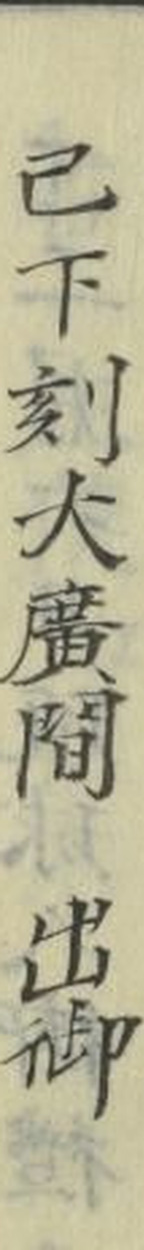己下刻大広間出御
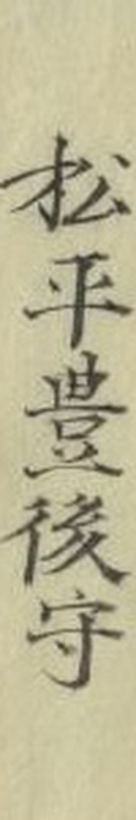松平豊後守
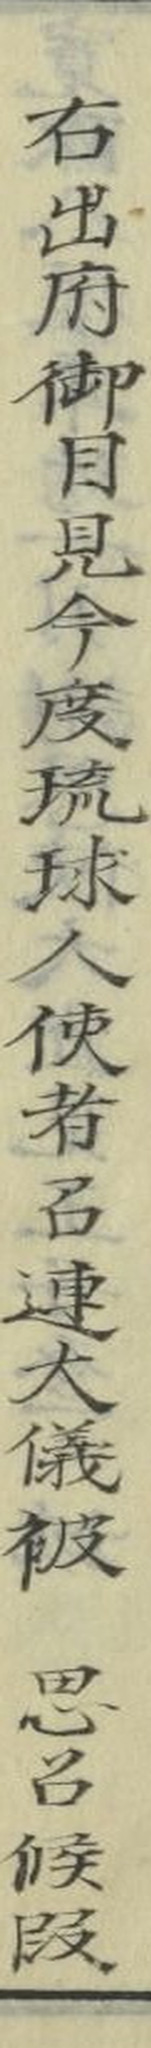右出府御目見今度琉球人使者召連大儀被思召候叚
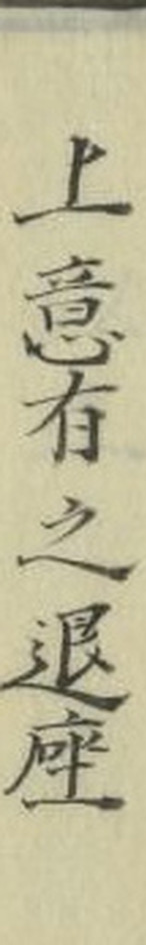上意有之退座
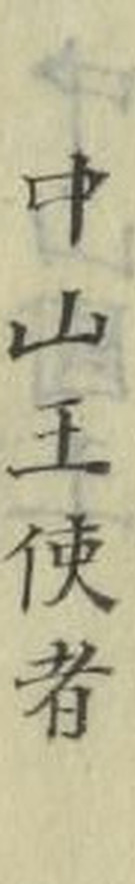中山王使者
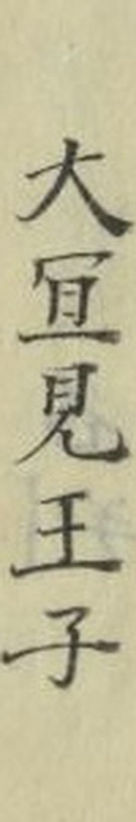大宜見王子
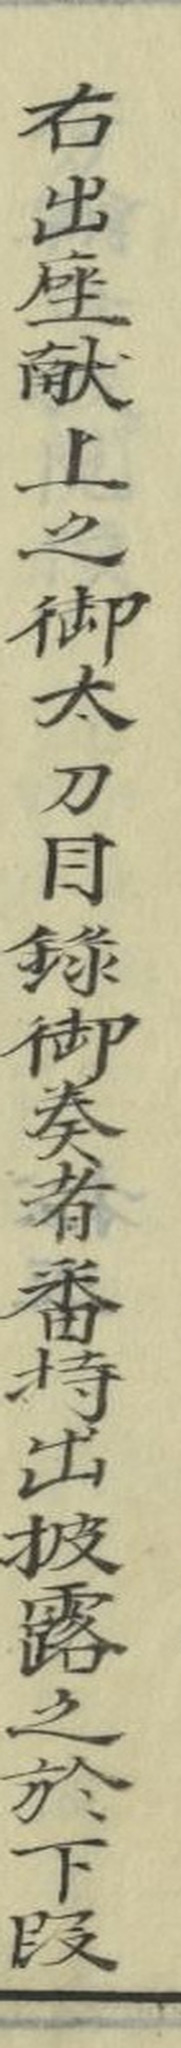右出座献上之御太刀目録御奏者番持出披露之於下叚
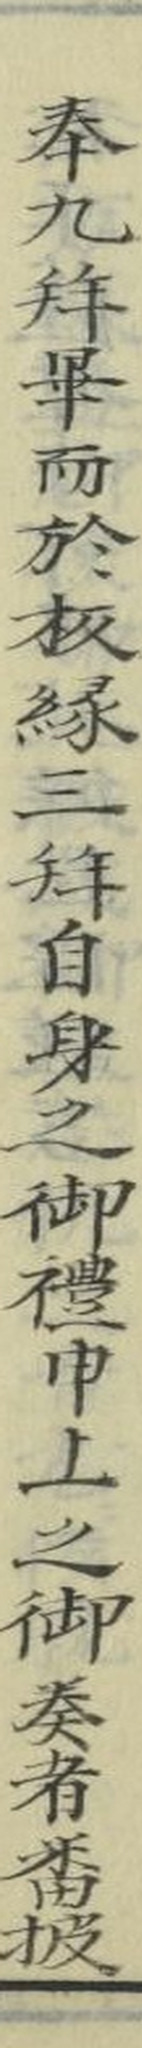奉九拝畢而於縁三拝自身之御礼申上之御奏者番披
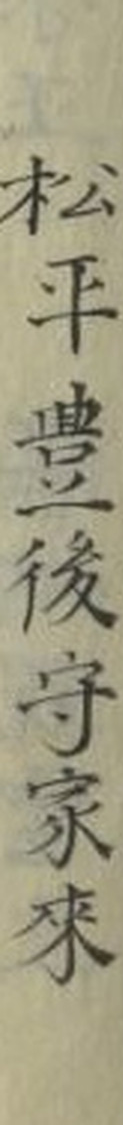松平豊後守家来
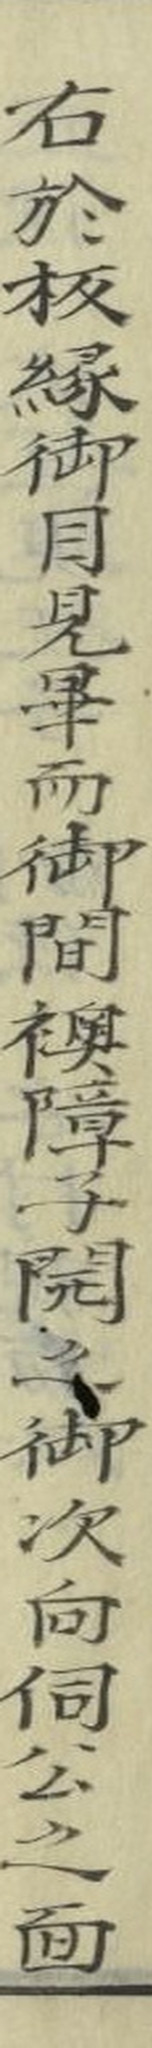右於板縁御目見畢而御間襖障子開之御次向伺公之面
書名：琉球沿革志 下
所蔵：University of the Ryukyus Library
